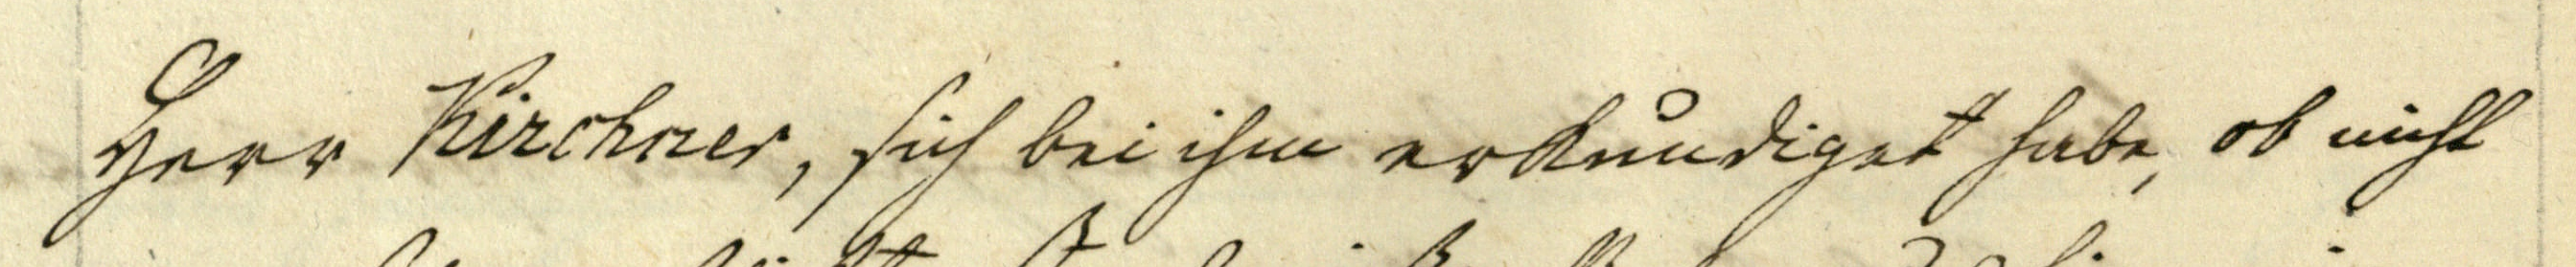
Herr Kirchner, sich bei ihm erkundiget habe, ob nicht
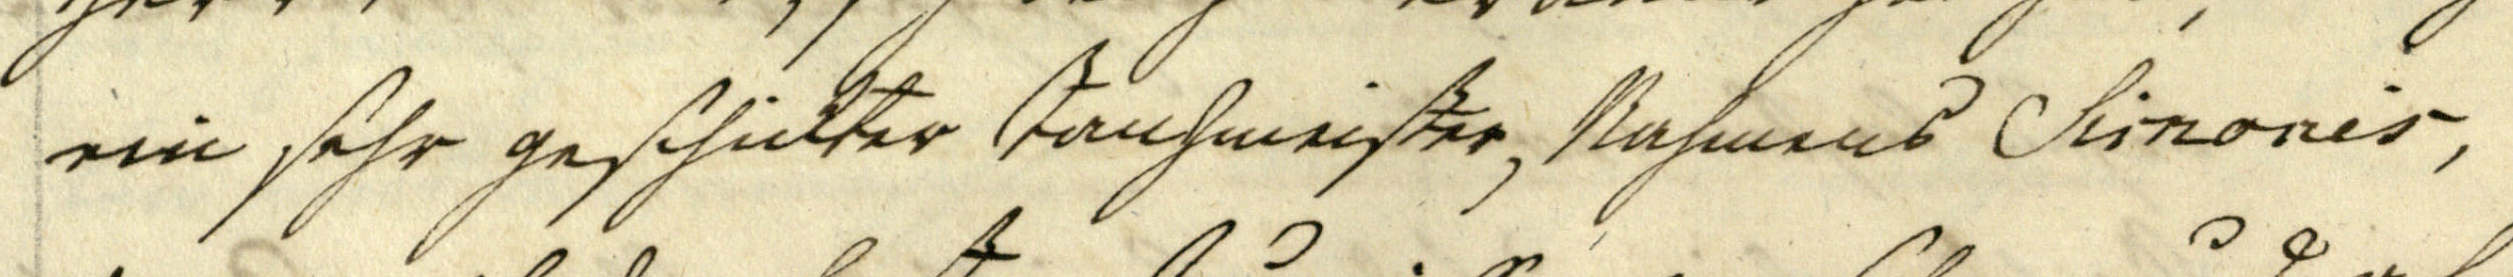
ein sehr geschickter Tanzmeister, Nahmens Simonis,
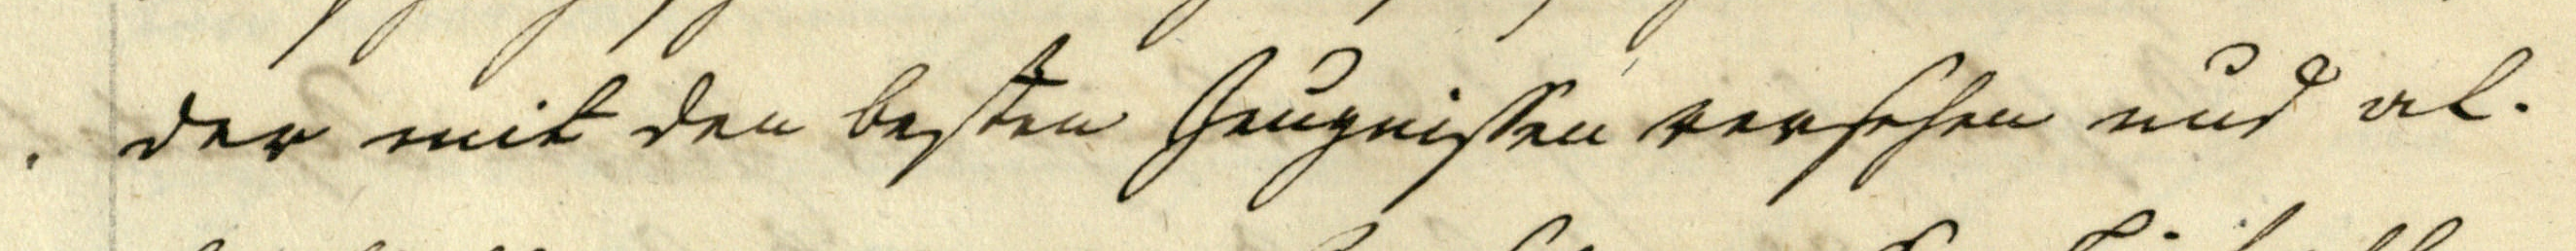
der mit den besten Zeugnissen versehen und al¬
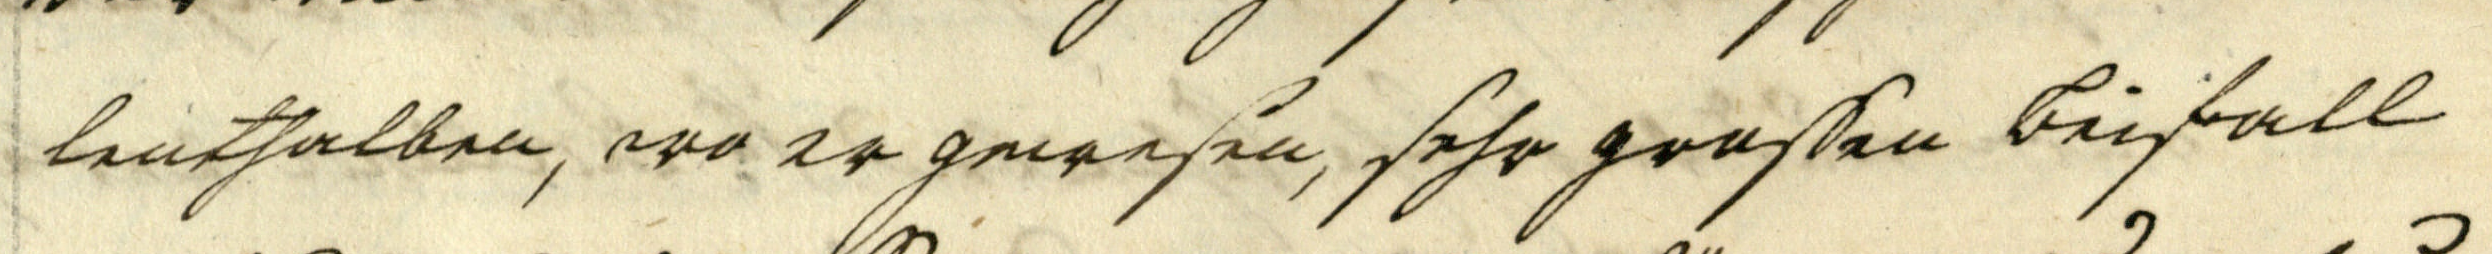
lenthalben, wo er gewesen, sehr grossen Beifall
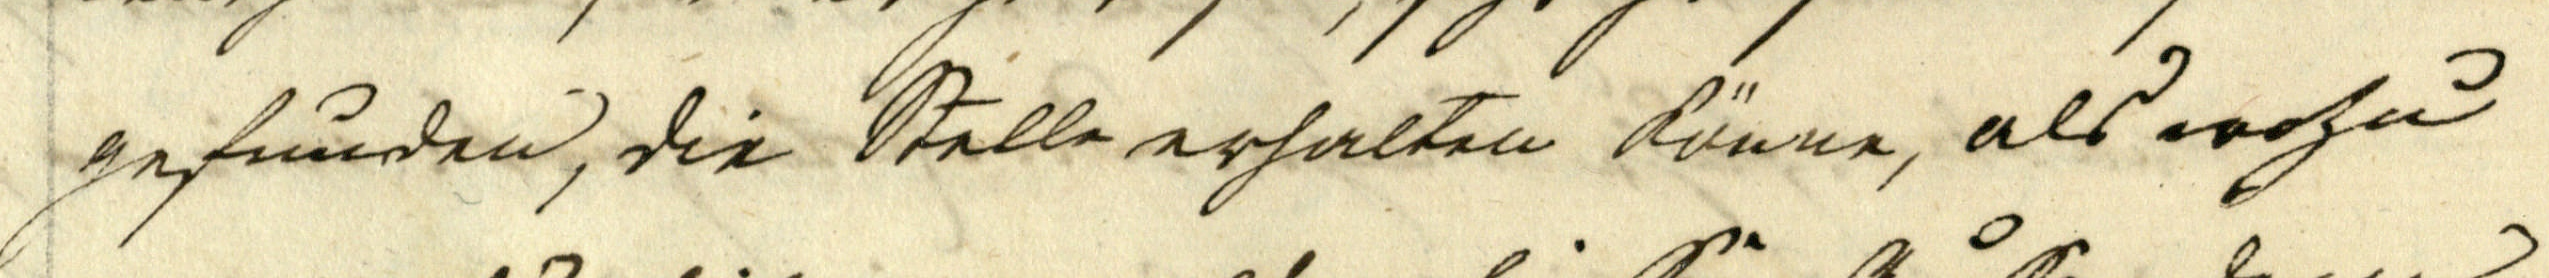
gefunden, die Stelle erhalten könne, als wozu
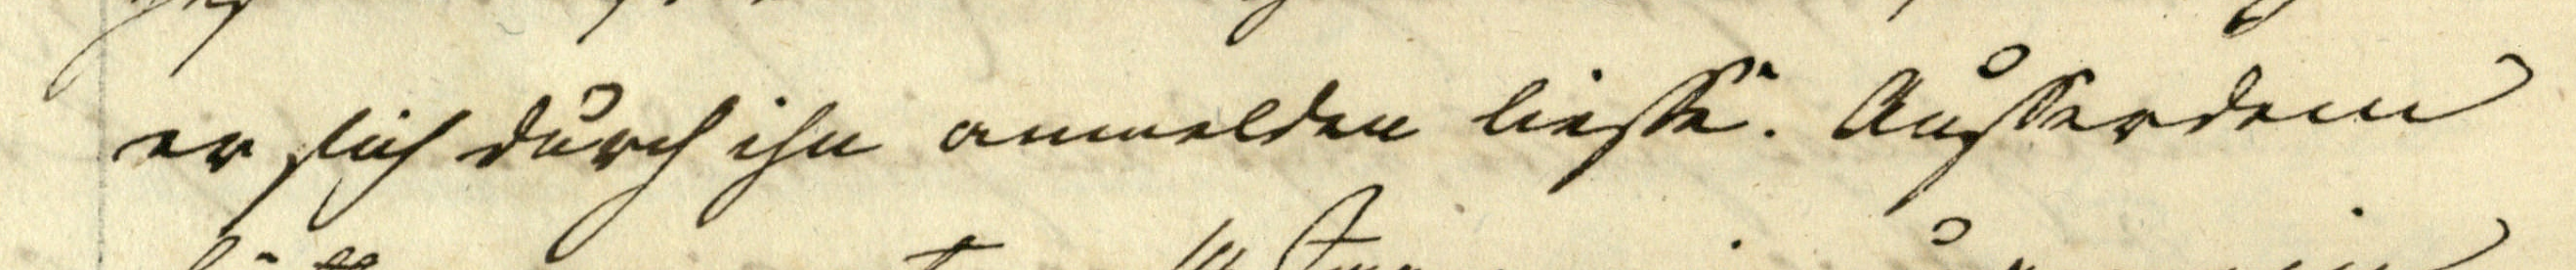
er sich durch ihn anmelden liesse. Ausserdem
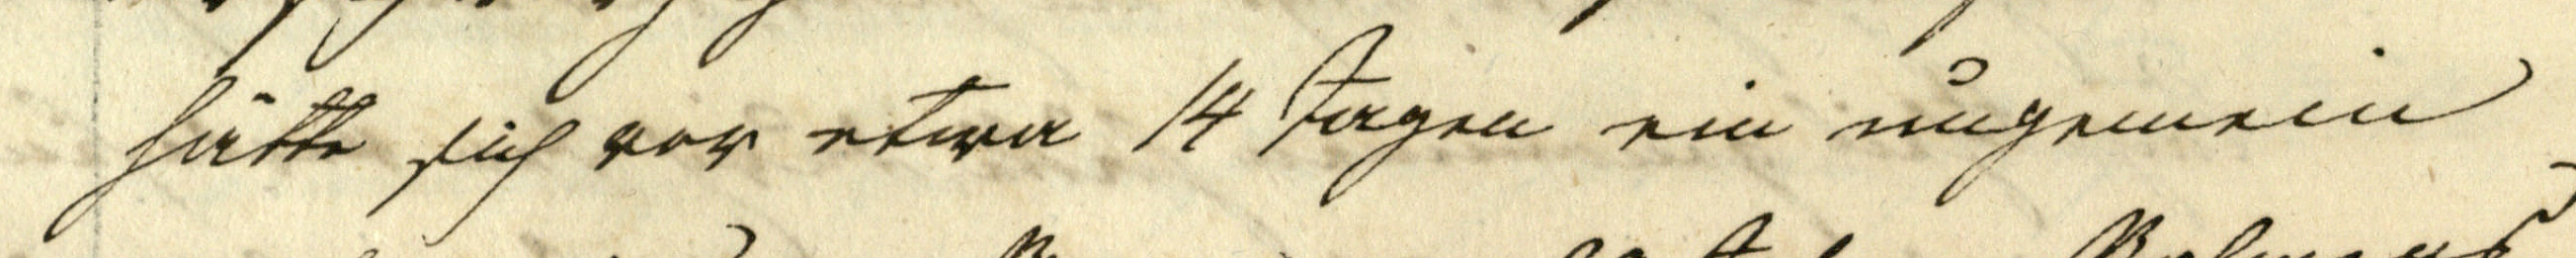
hätte sich vor etwa 14 Tagen ein ungemein
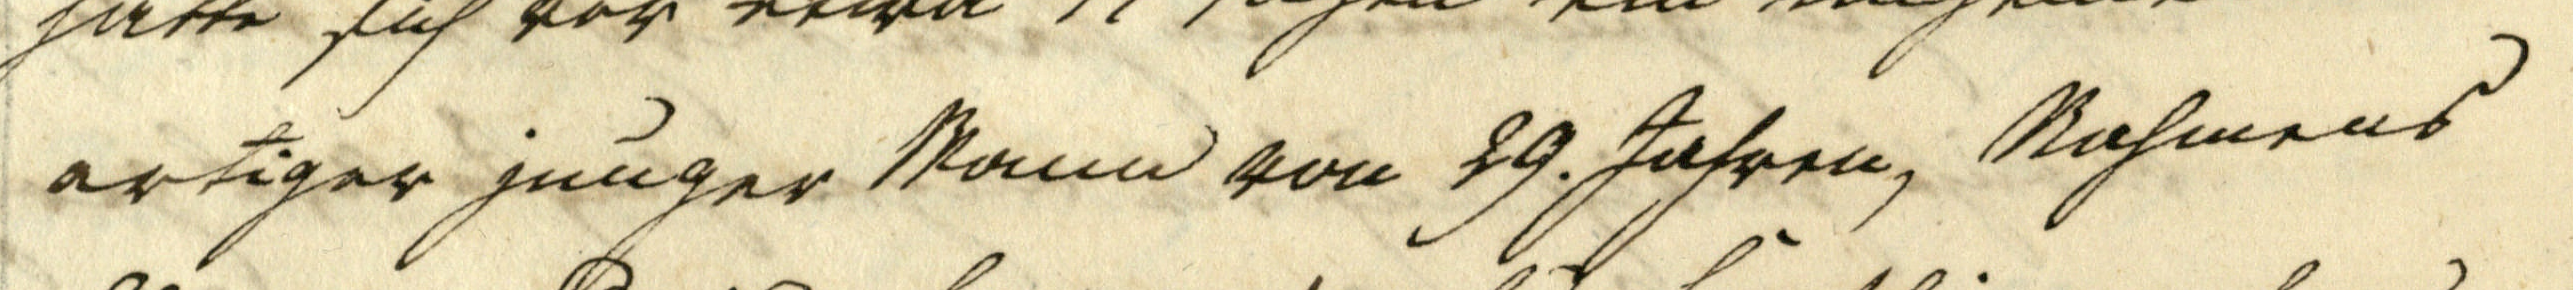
artiger junger Mann von 29 Jahren, Nahmens
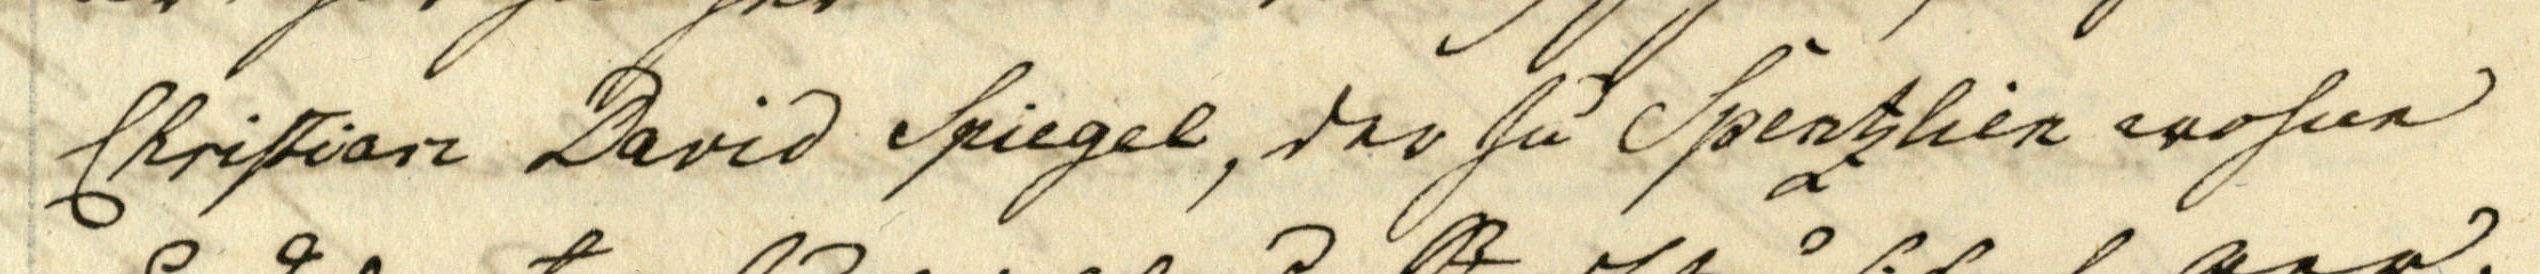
Christian David Spiegel, der zu Spentzlien wohne
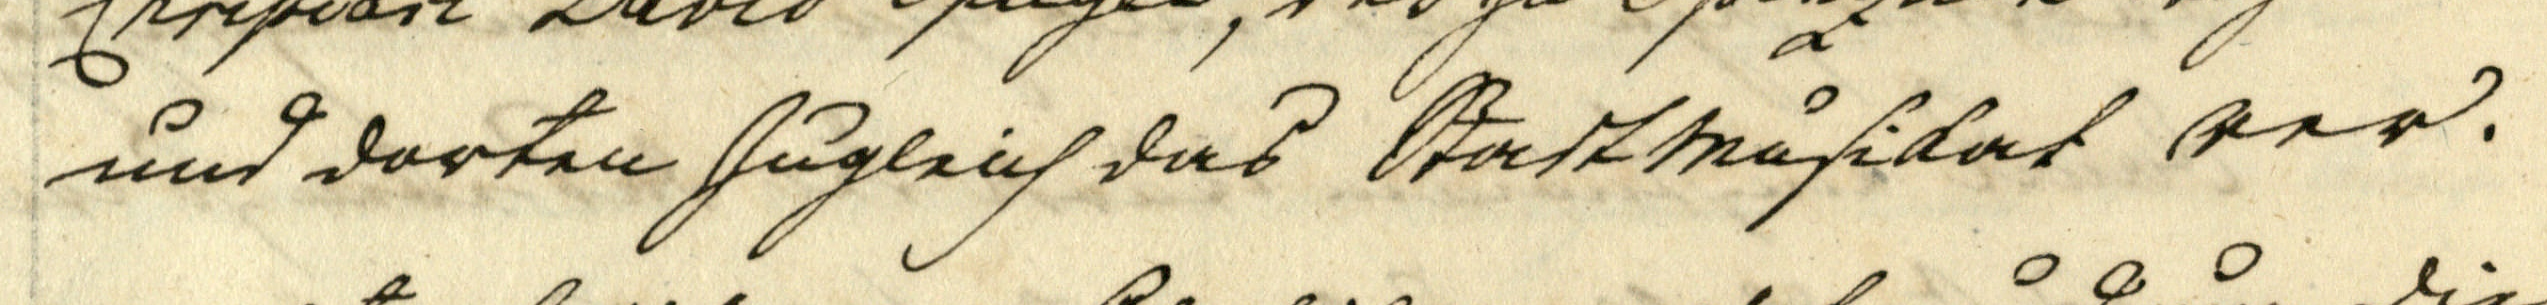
und dorten zugleich das Stadtmusikat ver¬
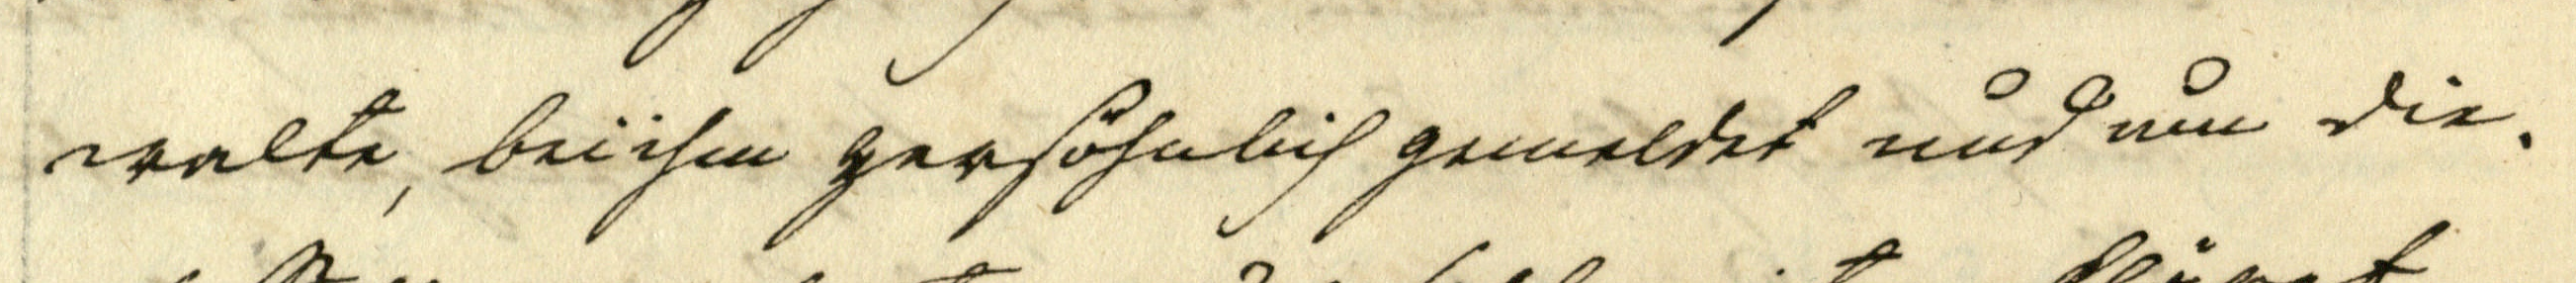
walte, bei ihm persöhnlich gemeldet und am die¬
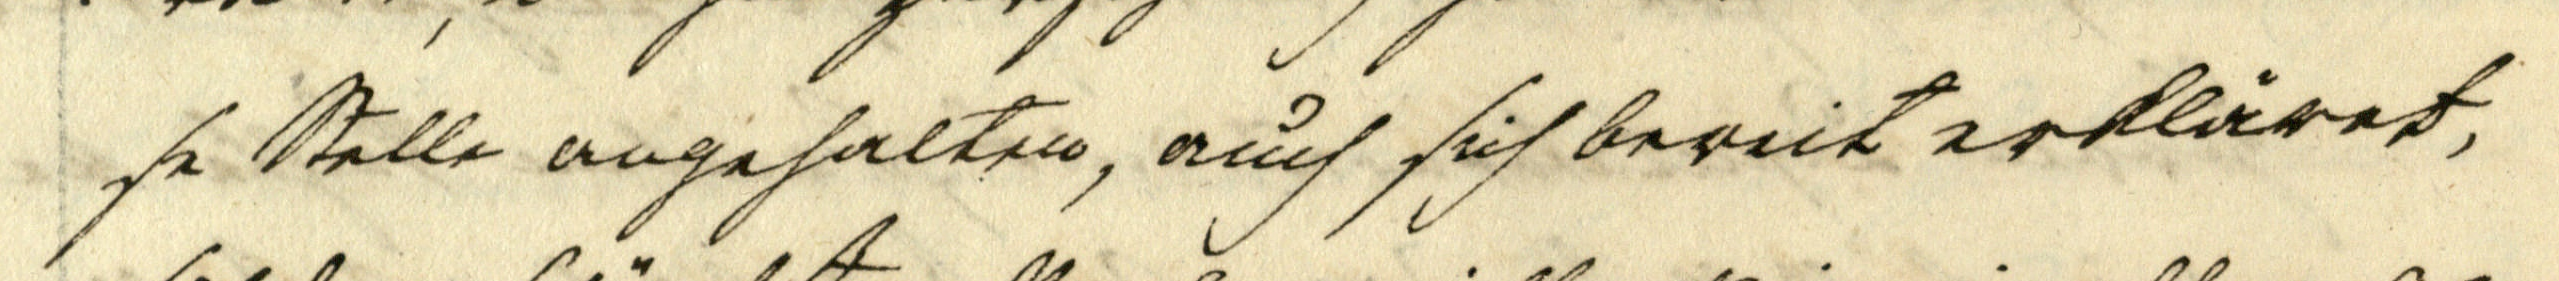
se Stelle angehalten, auch sich bereit erkläret,
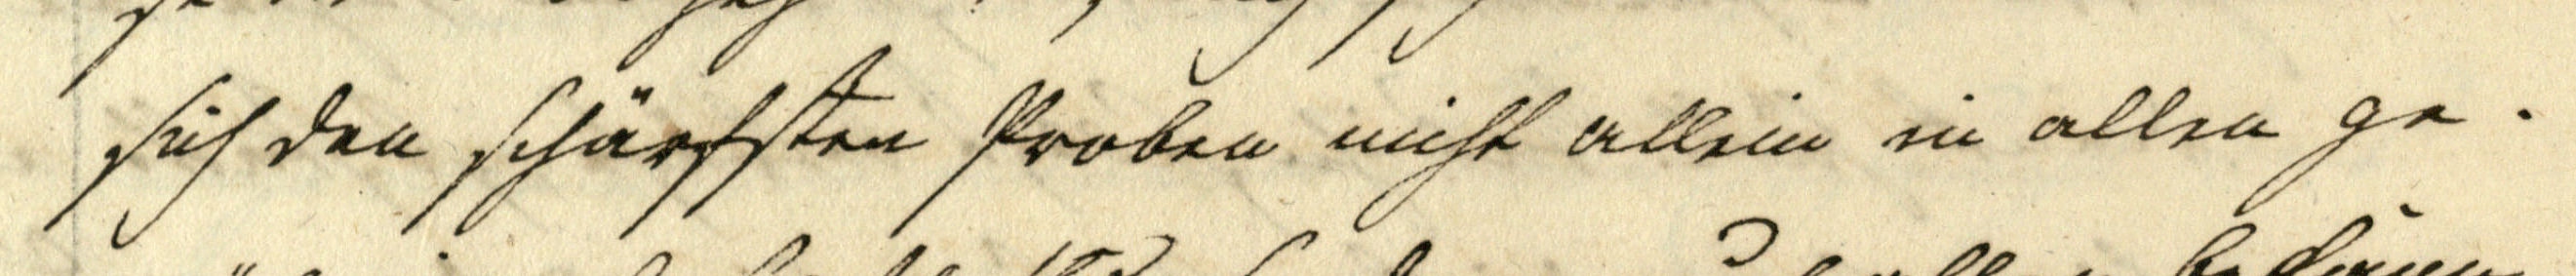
sich den schärfsten Proben nicht allein in allen ge¬
